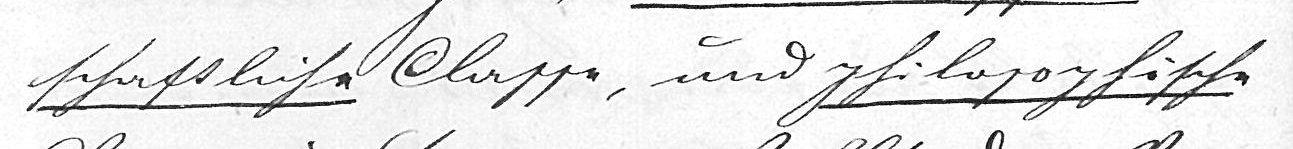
schaftliche Classe, und philosophische
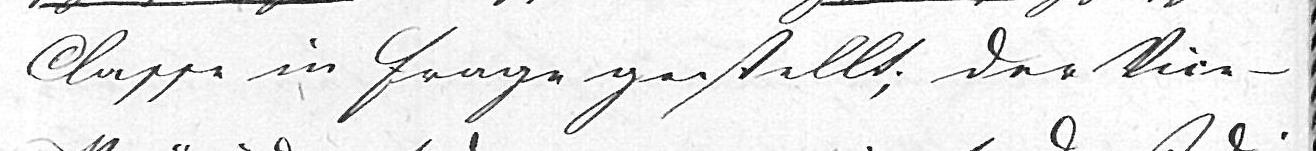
Classe in Frage gestellt, der Vice-
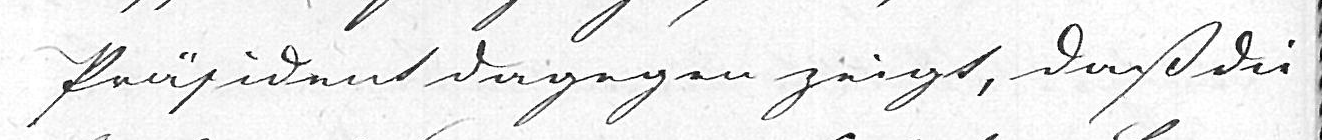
Präsident dagegen zeigt, daß die
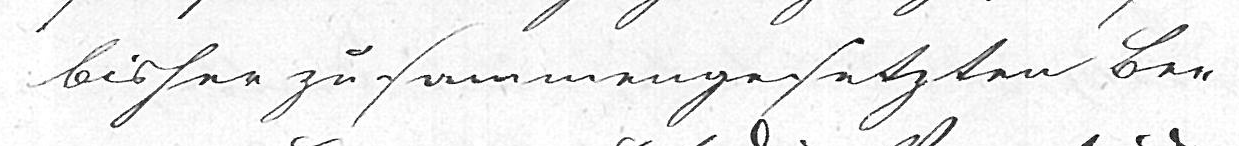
bisher zusammengesetzten Be-
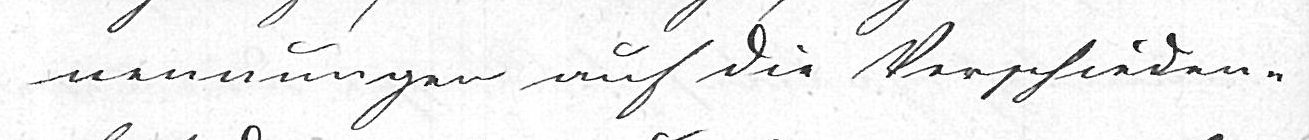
nennungen auch die Verschieden-
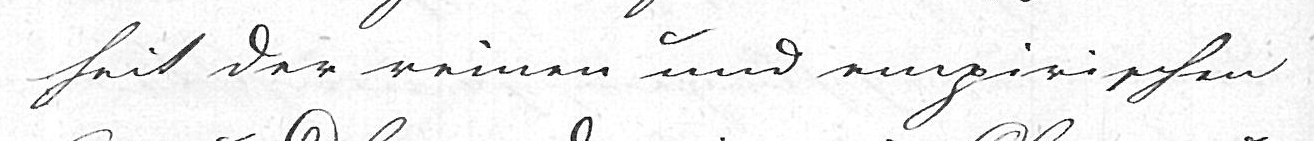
heit der reinen und empirischen
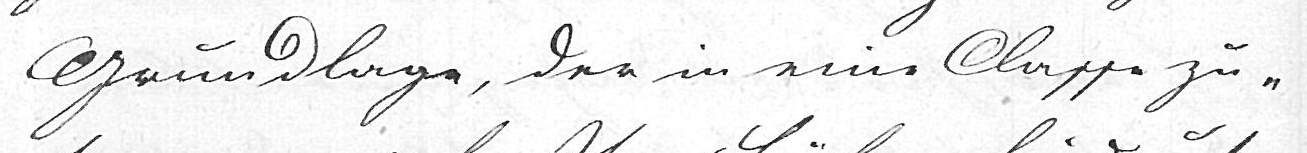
Grundlage, der in eine Classe zu-
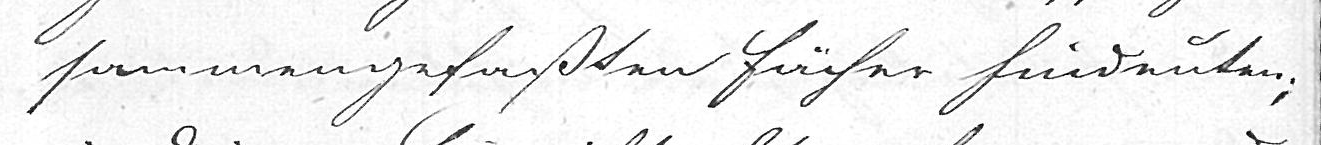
sammengefaßten Fächer hindeuten;
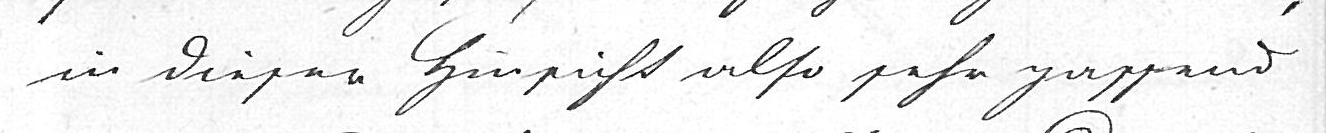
in dieser Hinsicht also sehr passend
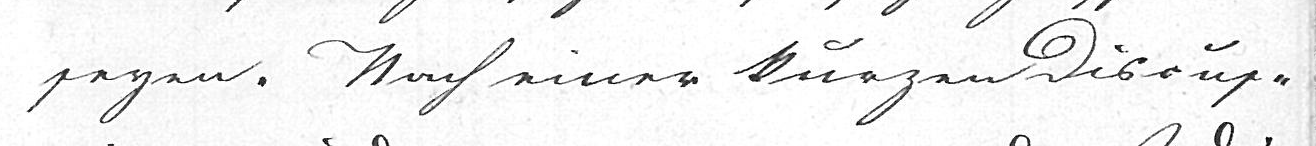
seyen. Nach einer kurzen Discus-
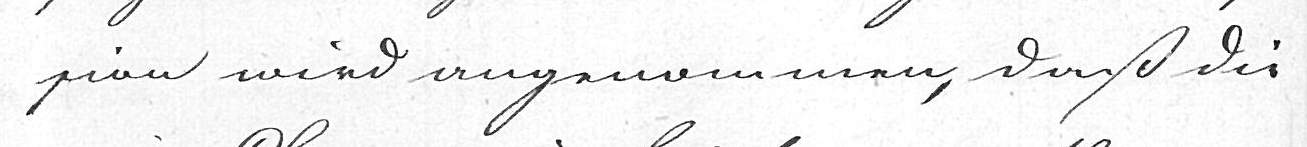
sion wird angenommen, daß die
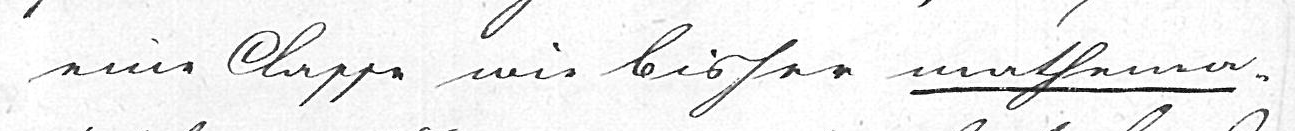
eine Classe wie bisher mathema-
